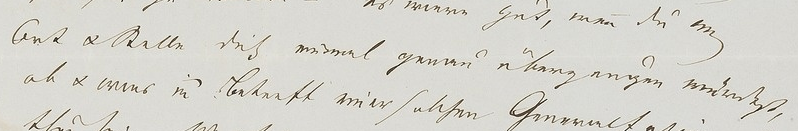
Ort & Stelle dich einmal genau überzeugen würdest,
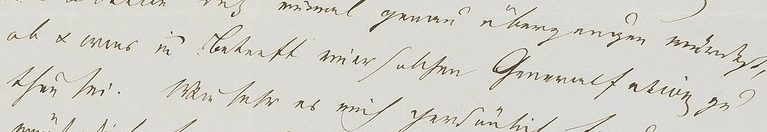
ob & was in Betreff einer solchen Generalfusion zu
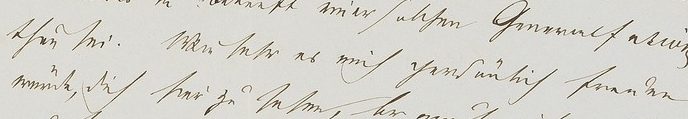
thun sei. Wie sehr es mich persönlich freuen
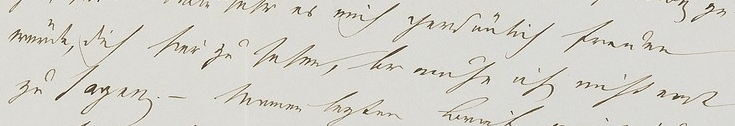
würde, dich hier zu sehen, brauche ich nicht erst
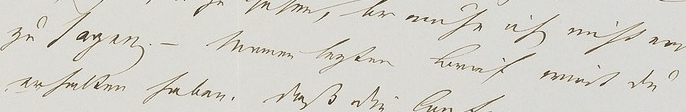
zu sagen. – Meinen lezten Brief wirst du
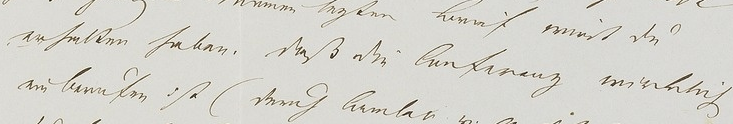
erhalten haben. Daß die Conferenz wirklich
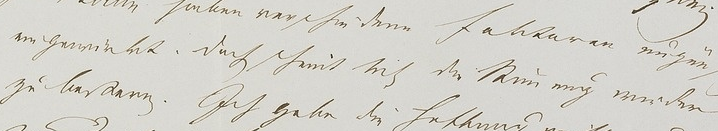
eingewirkt. Doch scheint sich die Stimmung wieder
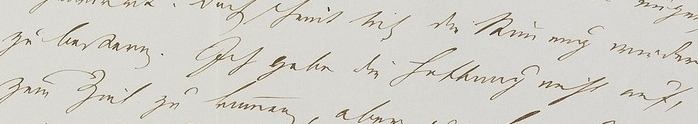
zu beßern. Ich gebe die Hoffnung nicht auf,
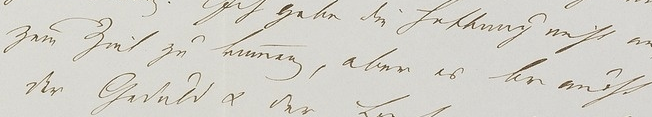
zum Ziel zu kommen, aber es braucht
